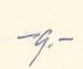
9
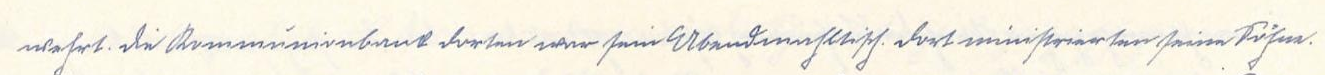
bewehrt. Die Kommunionbank dort war sein Abendmahltisch. Dort ministrierten seine Söhne.
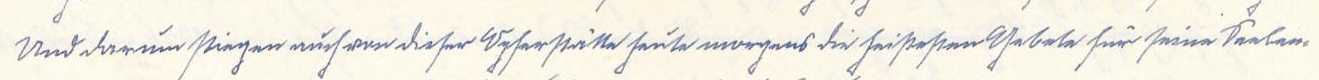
Und darum steigen auch von dieser Opferstätte heute morgens die heißesten Gebete für seine Seelen-
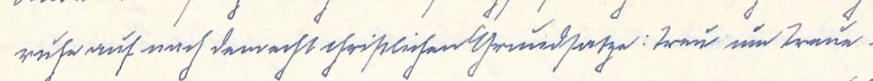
ruhe auf nach dem echt christlichen Grundsatze: Treu um Treue. …
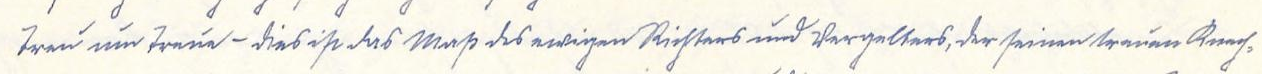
Treu um Treue- Sies ist das Maß des ewigen Richters und Vergelters, der seinen treuen Knech-
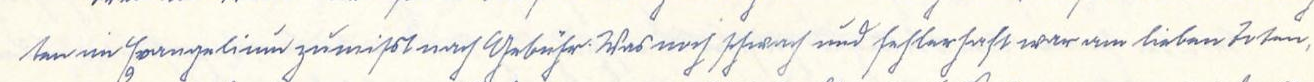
ten im Evangelium zumisst nach Gebühr. Was noch schwach und fehlerhaft war am lieben Toten,
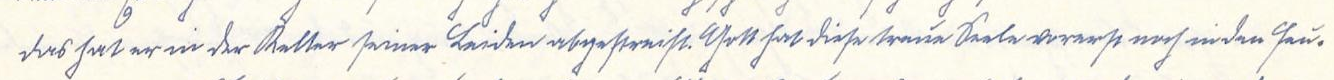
das hat der in der Ketter seiner Leiden abgestreift. Gott hat diese treue Seele vorerst noch in der Feu-
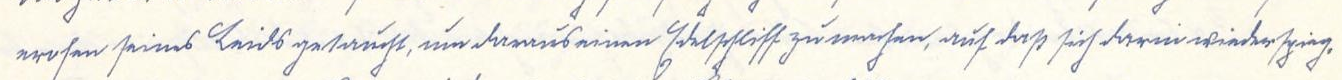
erofen seines Leids getaucht um daraus einen Edelschliff zu machen, auf daß sich darin der wiederspieg-
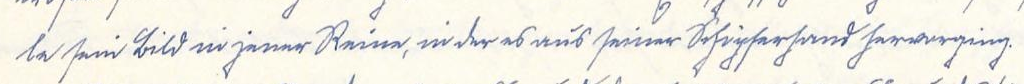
le sein Bild in jener Reine, in der es aus seiner Schöpferhand hervorging.
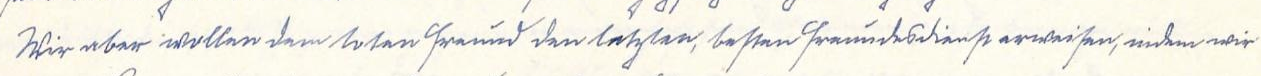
Wir aber wollen dem toten Freund den letzten, besten Freundschaftsdienst erweisen, indem wir
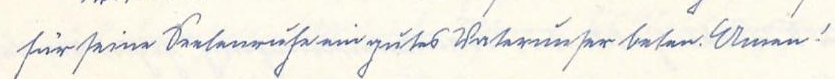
für seine Seelenruhe ein gutes Vaterunser beten. Amen!
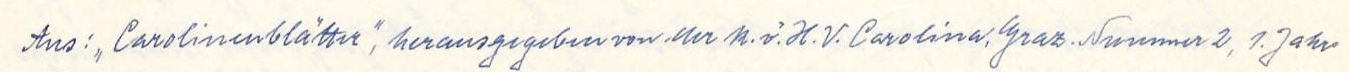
Aus: „Carolinenblätter“, herausgegeben von der k. ö. H. V. Carolina, Graz, Nummer 2, 1. Jahr-
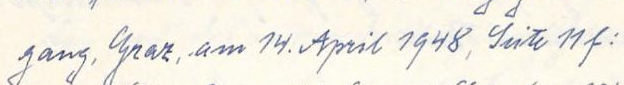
gang, Graz am 14. April 1948, Seite 11 f.:
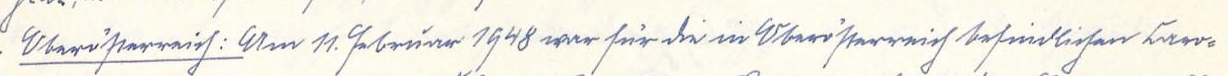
Oberösterreich: Am 11. Februar 1948 war für die in Oberösterreich befindlichen Caro-
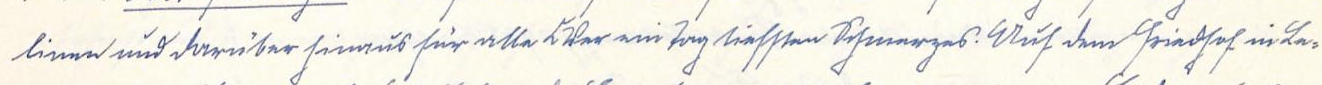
linen und darüber hinaus für alle CVer ein Tag tiefsten Schmerzes: auf dem Friedhof in Le-
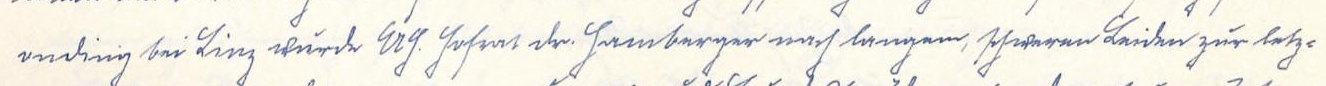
onding bei Linz wurde Hofrat Dr. Hans Hamberger nach langem, schweren Leiden zur letz-
